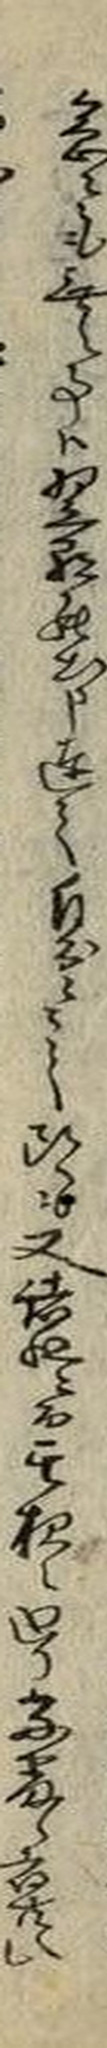急々にも無之事は翌朝罷出申達之自分々々之頭へも又諸組にて其夜之廻り当番之者共へも
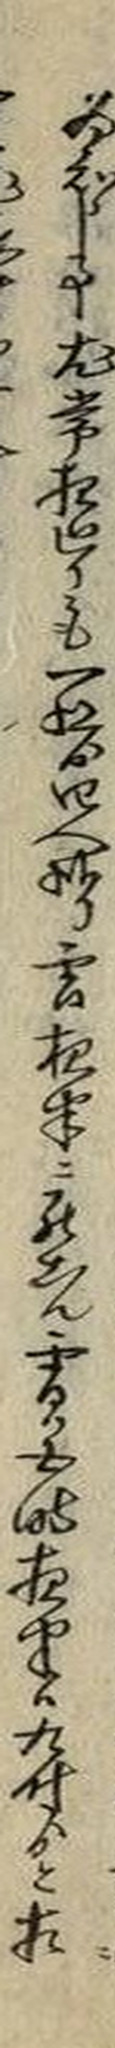為知申事尤常夜廻りにも一組ゟ四人掛り宵夜半に罷出ル宵は五時夜半は九時ゟと相
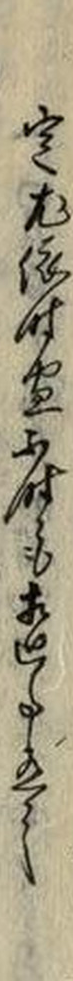定尤依時宜不時にも相廻事有之
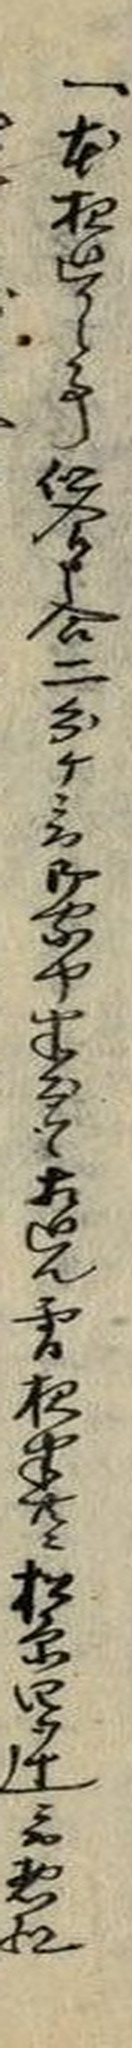一本夜廻り之事組合申合二分ケにて御家中半分ツヽ相廻ル宵夜半共に松原四ツ辻にて惣組
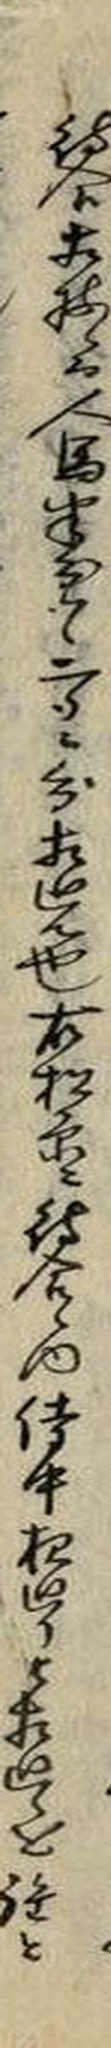待合相揃候て人馬半分ツヽ二ツに分相廻ル也右松原に待合候内侍中夜廻り被相廻候を誰と
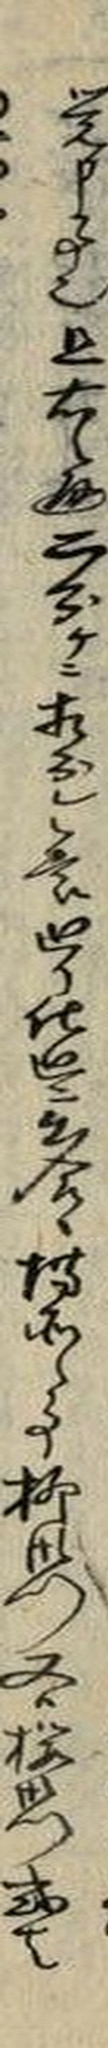覚申事也且右之通二分ケに相分レ候節廻り仕廻に出合候場所之事柳御門又は桜御門或は
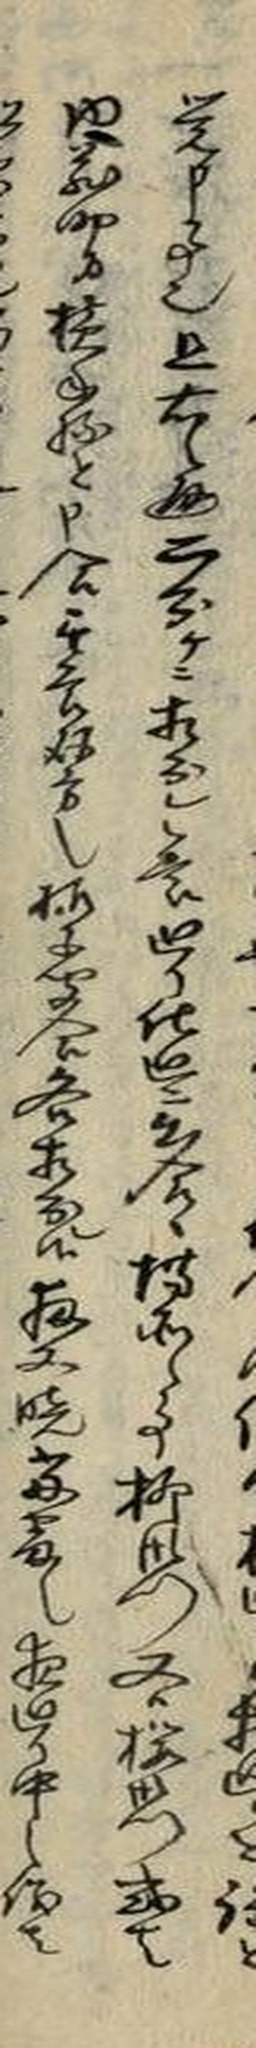内蔵助方横手抔と申合其節双方之様子聞合各相分レ候扨又暁当番之夜廻り中之儀は
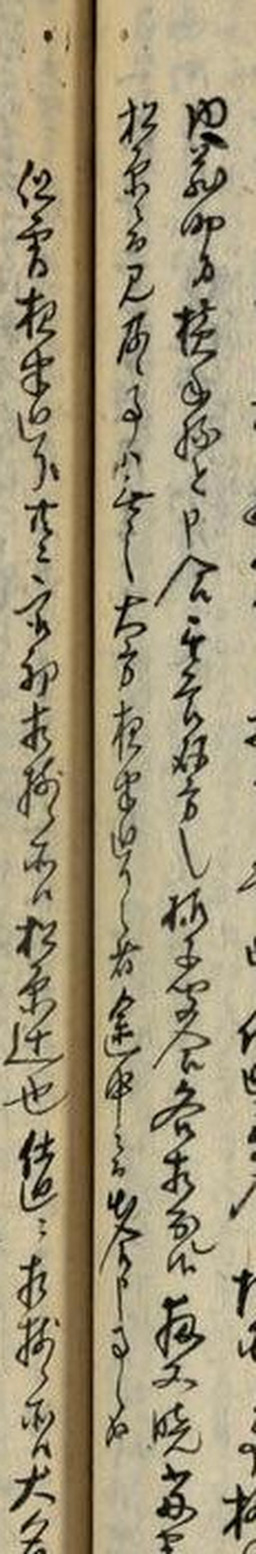松原にて見及候事は無之大方夜半廻り之者途中にて出合申事之由
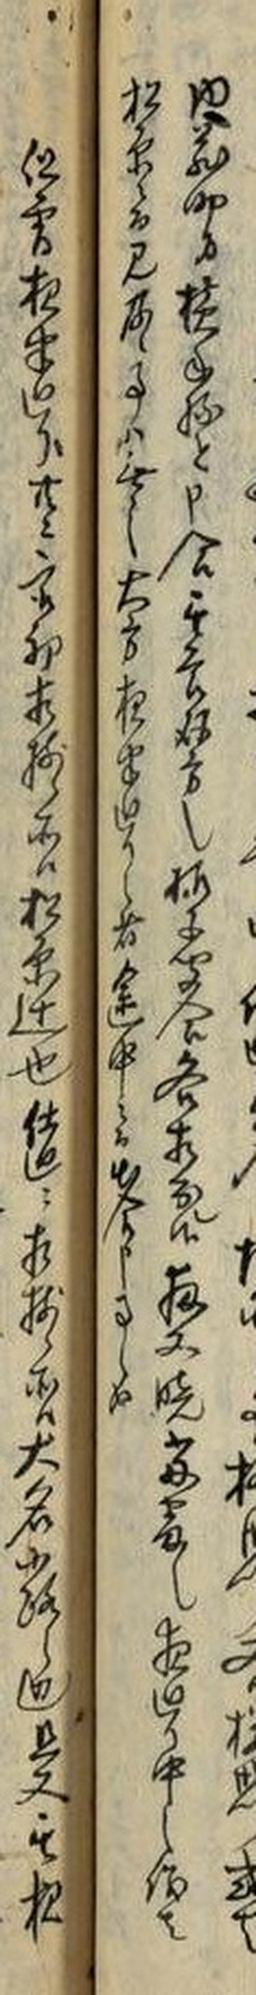松原にて見及候事は無之大方夜半廻り之者途中にて出合申事之由
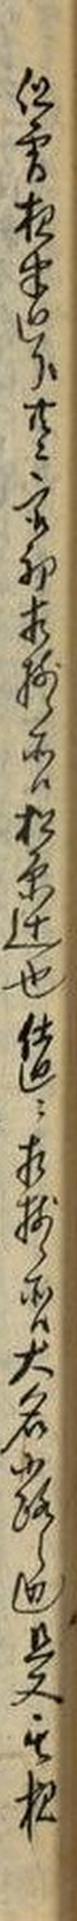但宵夜半廻り共に最初相揃候所は松原辻也仕廻に相揃候所は大名小路之辺且又其夜
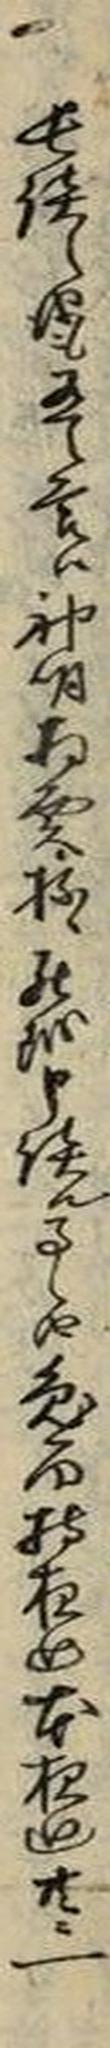長談之儀も有之節は神明拝殿抔へ罷越申談ル事之由兎角持夜廻本夜廻共に一
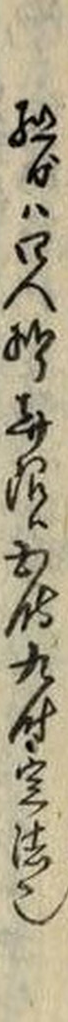組ゟは四人掛り刻限は五時九時定法也
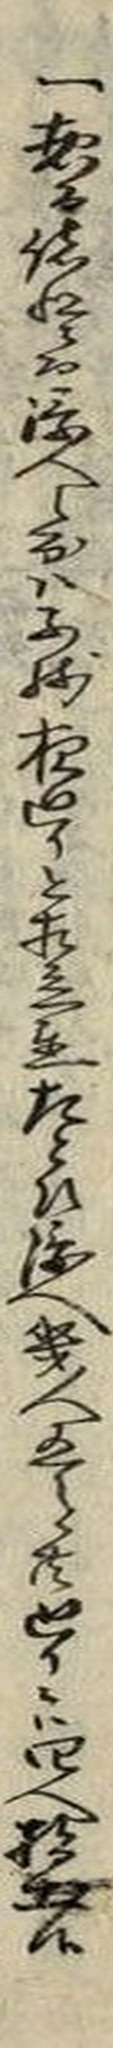一惣て諸組にて添人之分は不残夜廻りと相立置たとひ添人幾人有之候共廻りには四人指出候
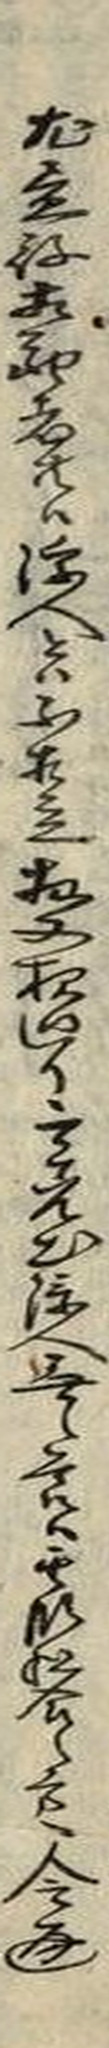尤昼役相勤候者共は添人とは不相立扨又夜廻りへ可差出添人無之節は其段組合之方へ令通
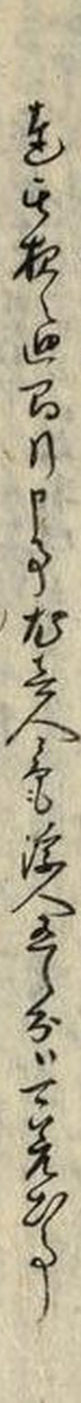達其夜之廻間引申事尤壱人にても添人有之分は可差出事
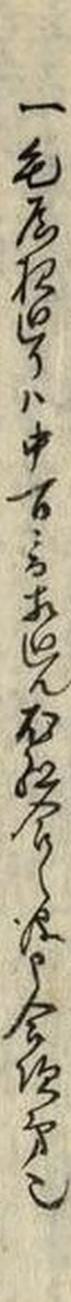一毛屋夜廻りは中間にて相廻ル尤組合之儀申合次第也
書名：御城下諸事之部
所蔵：福井県文書館 Fukui Prefectural Archives
